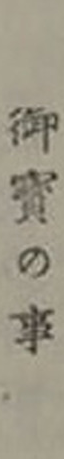御宝の事
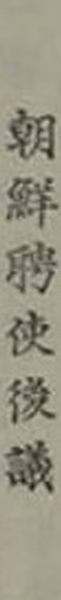朝鮮聘使後議
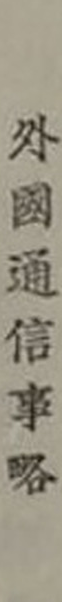外国通信事略
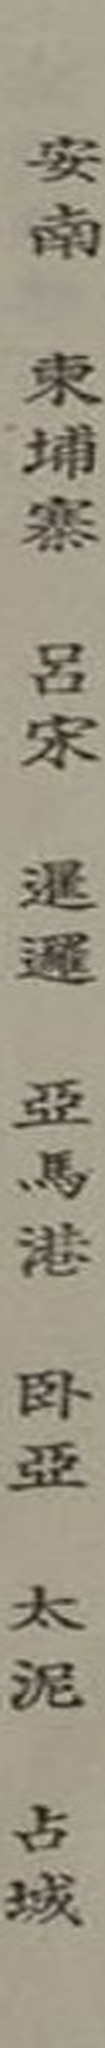安南東埔寨呂宋暹邏亜馬港臥亜太泥占城
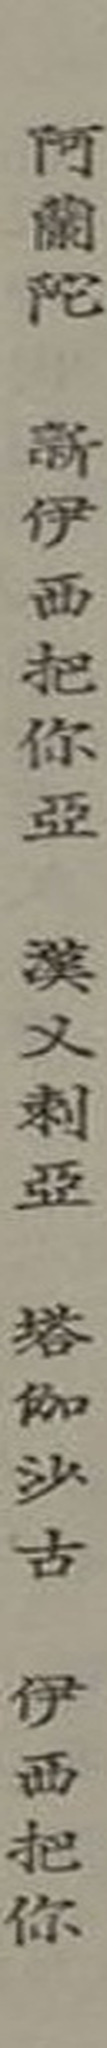阿蘭陀新伊西把你亜漢乂剌亜塔伽沙古伊西把你
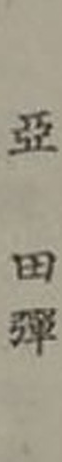亜田弾
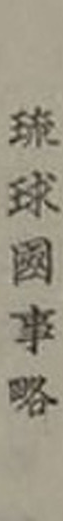琉球国事略
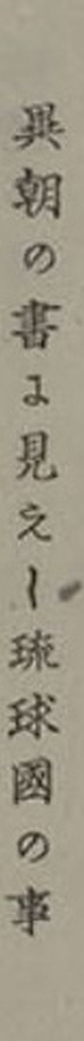異朝の書に見えし琉球国の事
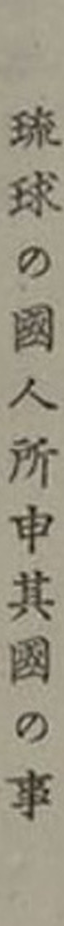琉球の国人所申其国の事
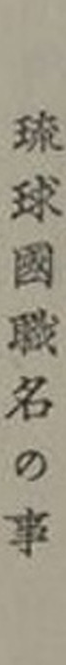琉球国職名の事
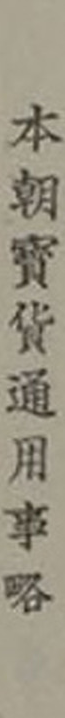本朝宝貨通用事略
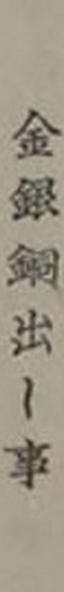金銀銅出し事
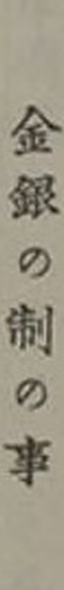金銀の制の事
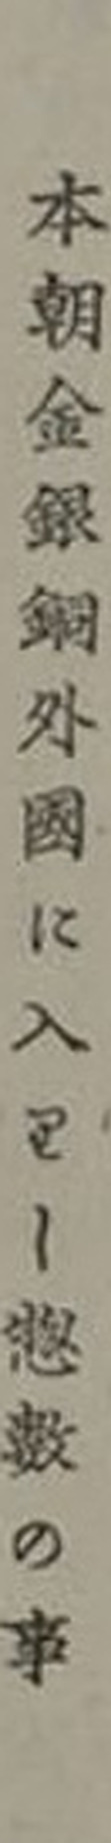本朝金銀銅外国に入りし惣数の事
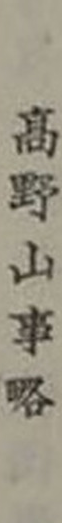高野山事略
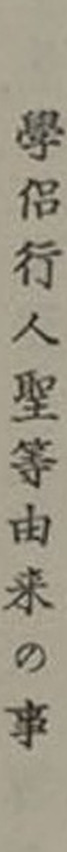学侶行人聖等由来の事
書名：五事略 上
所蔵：University of the Ryukyus Library
